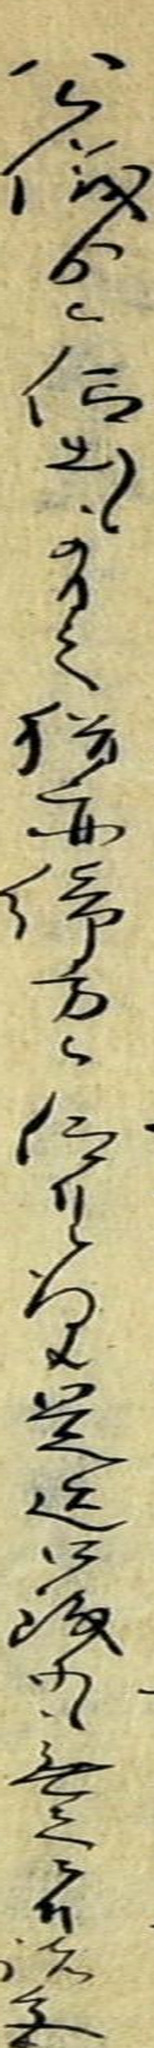公儀ゟ被仰出も有之猶亦締方被仰付候得共是迄口銭にも無之ニ付諸色
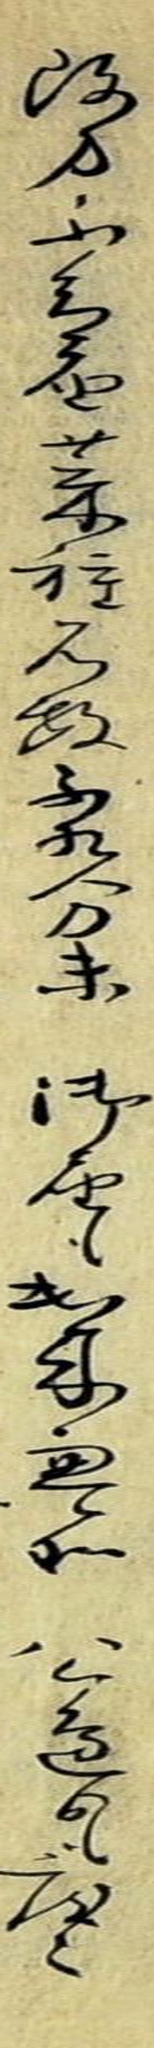改方不参届菜種石数不相分未御届も出来兼候処公辺ゟも度々
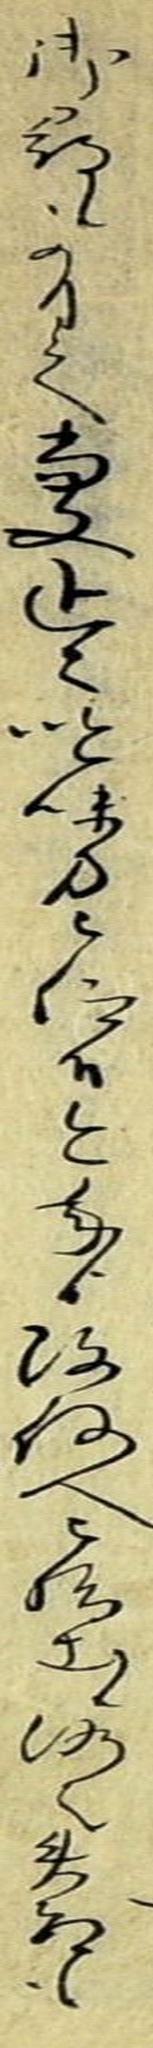御尋も有之尚又追々吟味方被仰付今年ゟ改役人被指出候仍之失却も
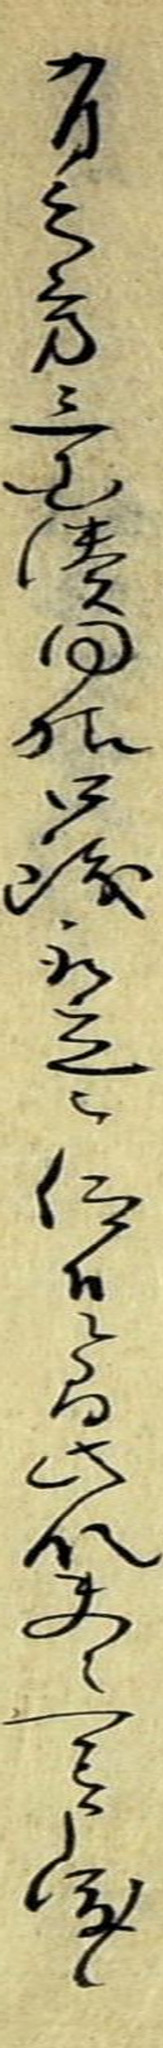有之旁三国湊同様口銭取立被仰付候間此段夫々可被申渡候
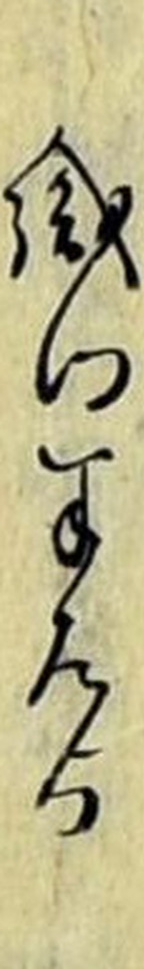織田半左衛門
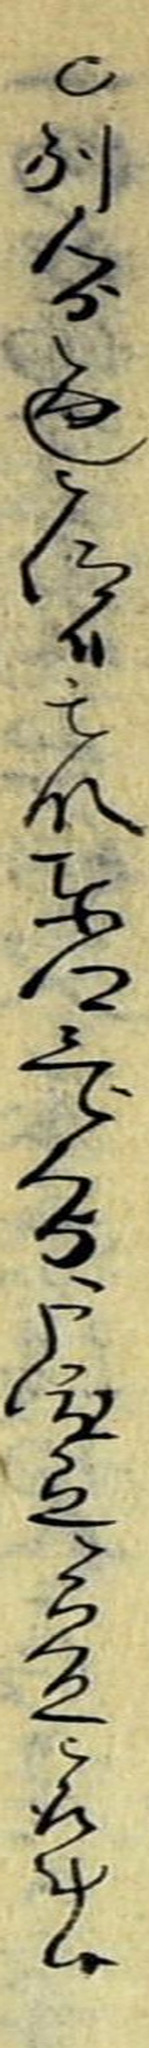〇別紙之通被仰付其段東郷三郎右衛門へ申渡置候間宜被取計候

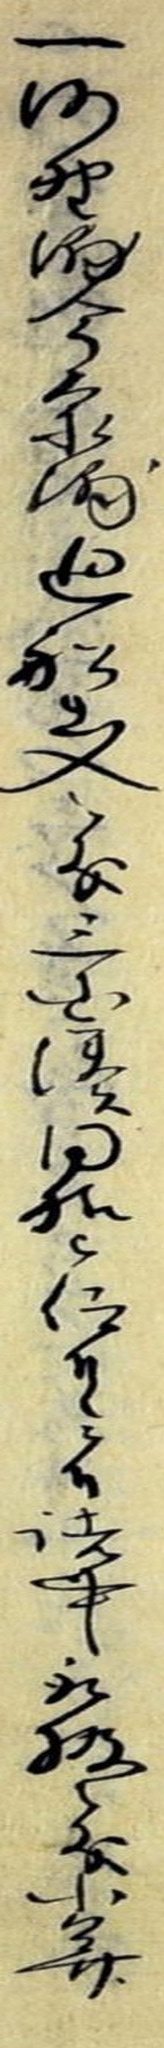一河野浦今泉浦廻船出入之義三国湊同様被仰付候ニ付諸事取扱之義小算
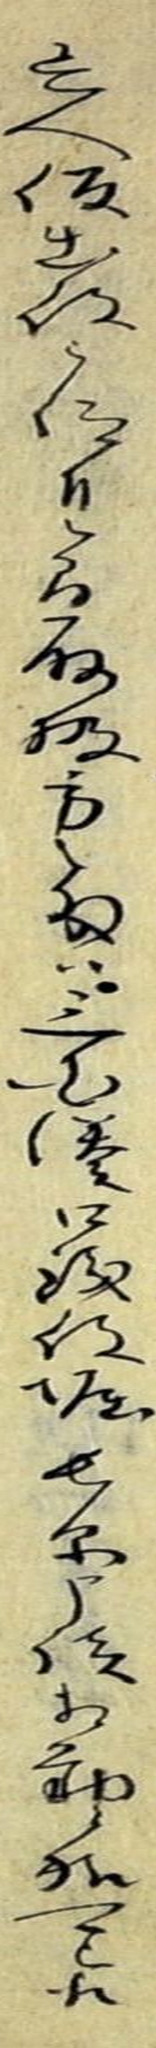壱人仮出役被仰付候間取扱方之義ハ三国湊口銭役堀長兵衛申談相勤候様可被取
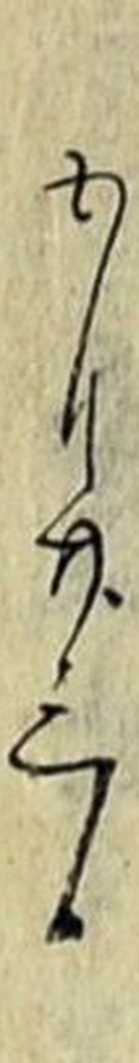五月廿三日
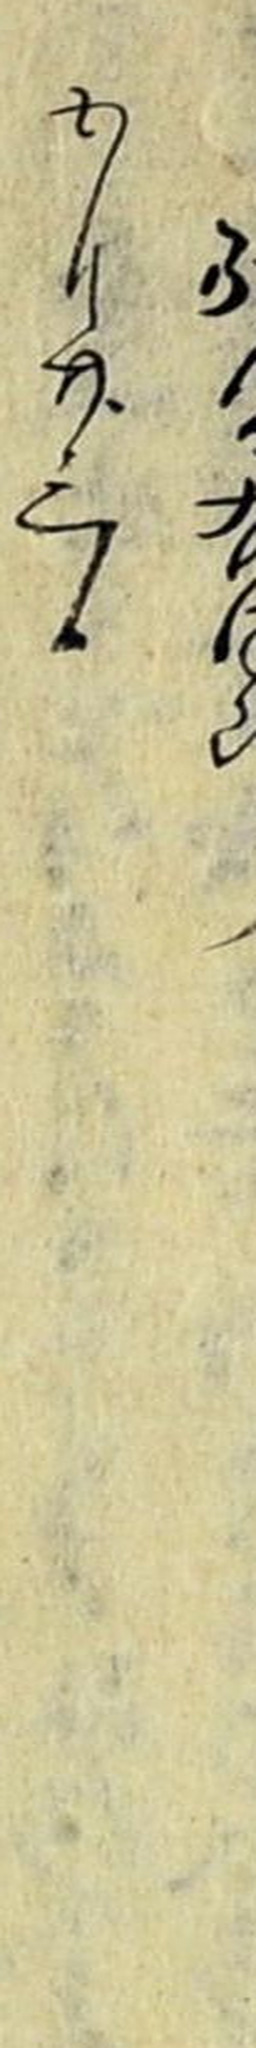五月廿三日
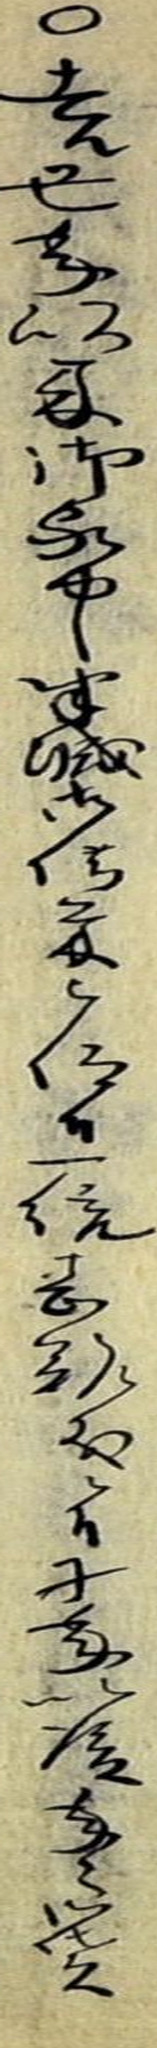〇去ル丑年以来御家中半減御借米被仰付一統甚難儀ニ付寅年以後年々御貸
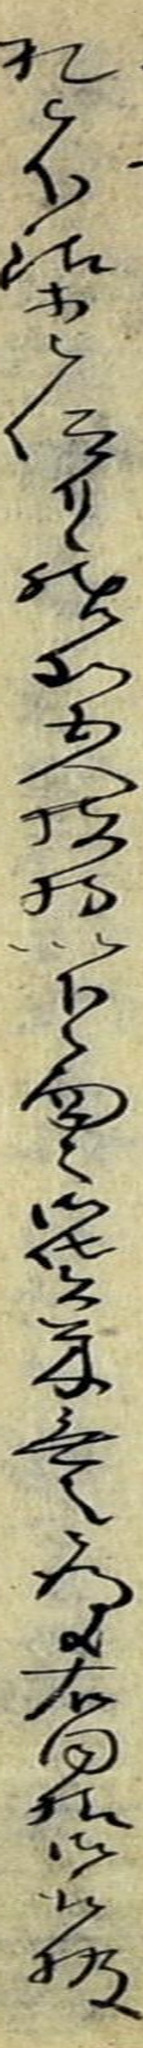札被下銀等被仰付候然ル処五人扶持以下之面々御貸米無之候得共右同様御取扱
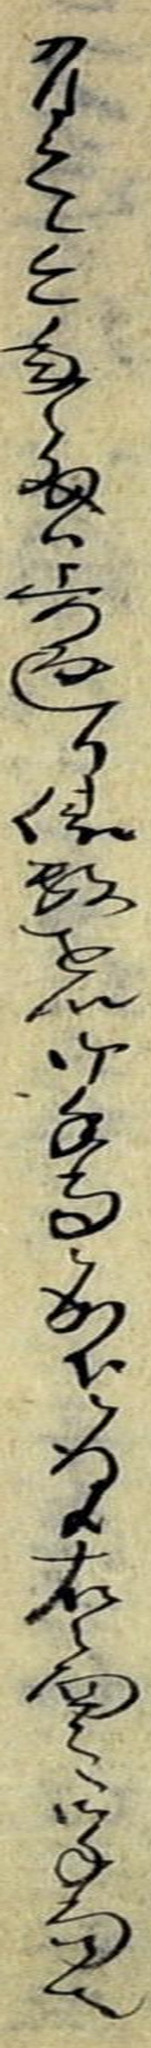有之今年之義ハ歩通り俵数を以御手当被成下候得共右之面々へ御手当者
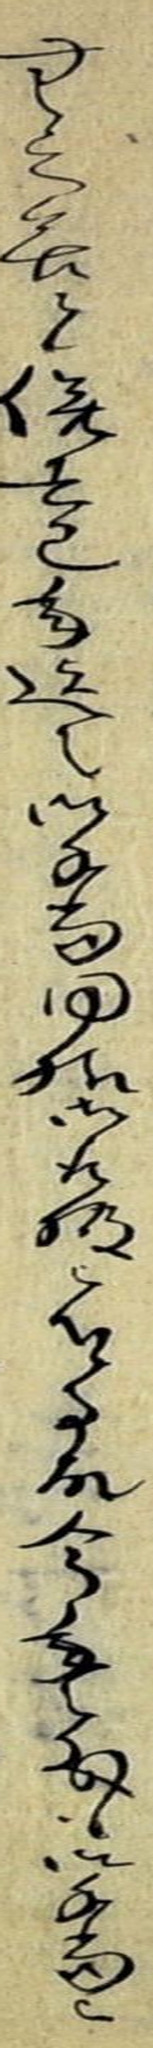無之筈ニ候併去巳年迄之御手当同様御取扱被下候事故今年之義も御手当被
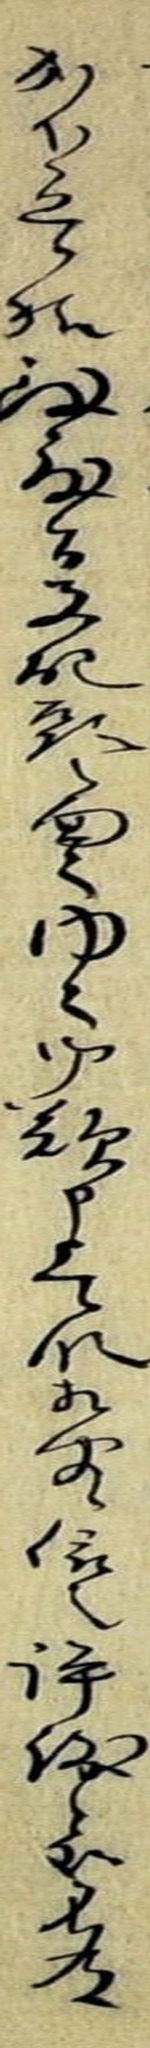成下置候様致度旨支配頭之面々内々御歎申上候段相聞依之評議候処不及
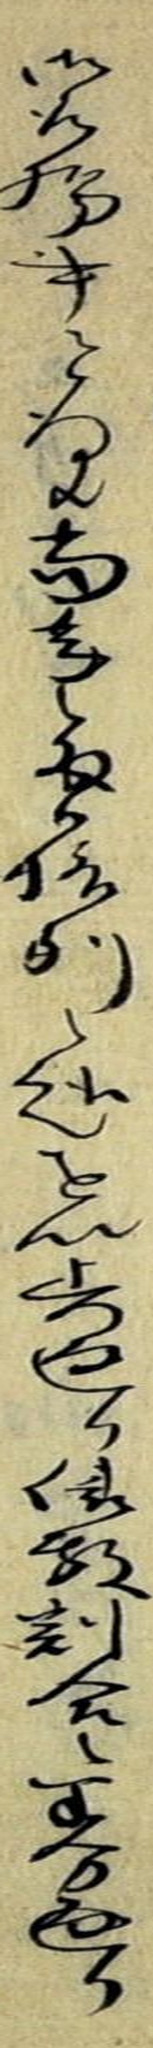御取揚事ニ候得共当年之義ハ格別之趣を以歩通り俵数割合之半分通り
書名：命令之部 三
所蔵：福井県文書館 Fukui Prefectural Archives
